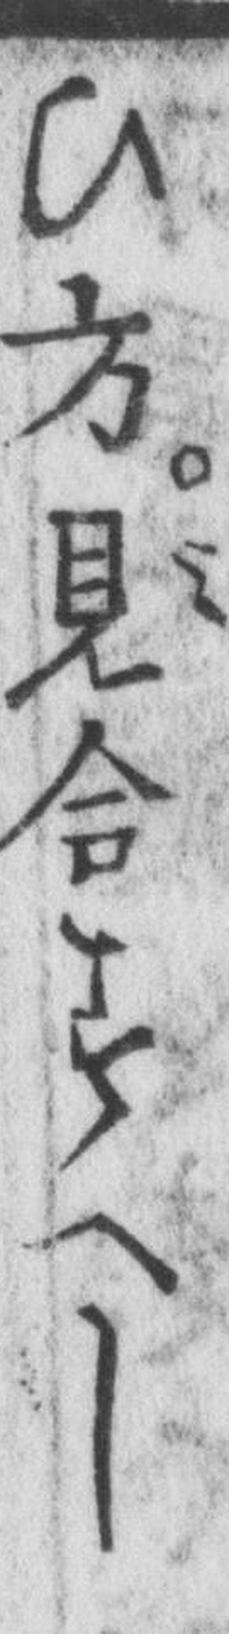ひ方。見合すへし
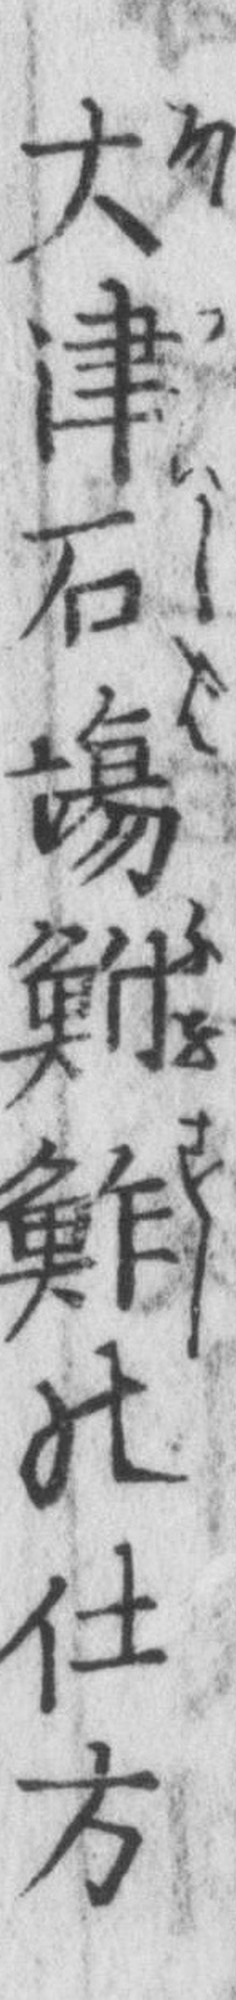大津石場鮒鮓の仕方
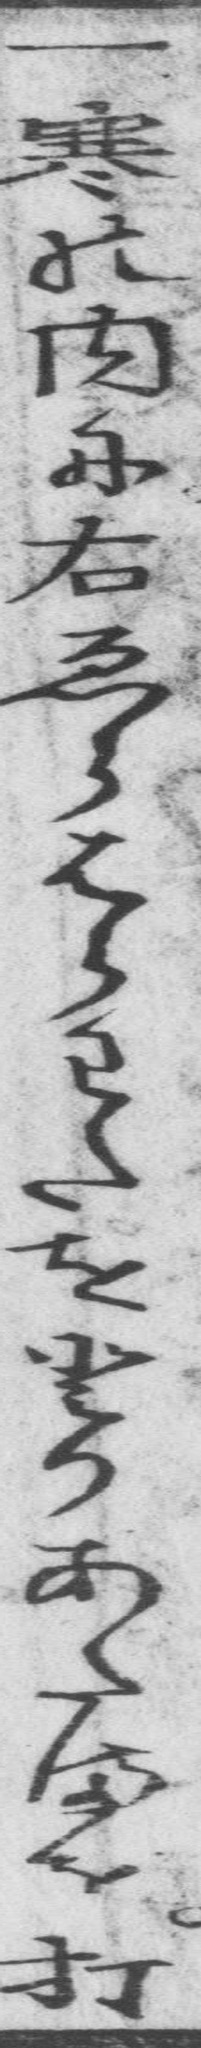一寒の内に。右ゑらはらわたをとりあたまを。打
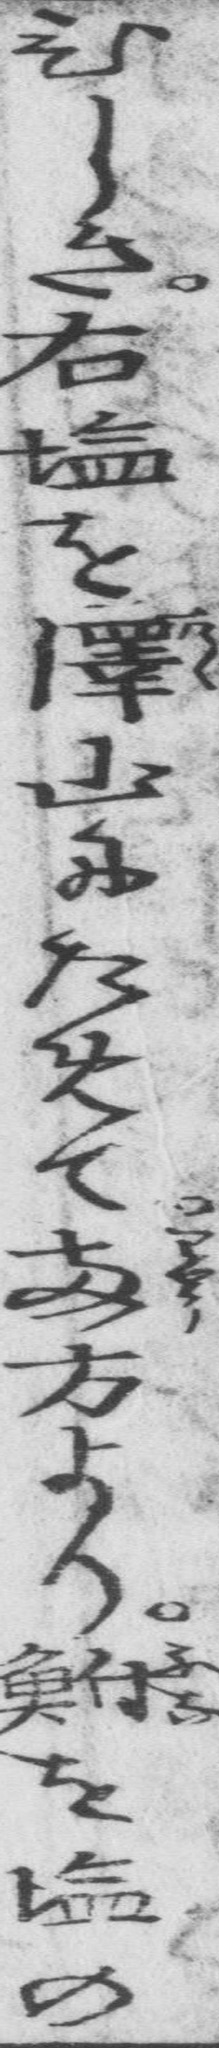ひしき。右塩を沢山にためて。両方より。鮒を塩の
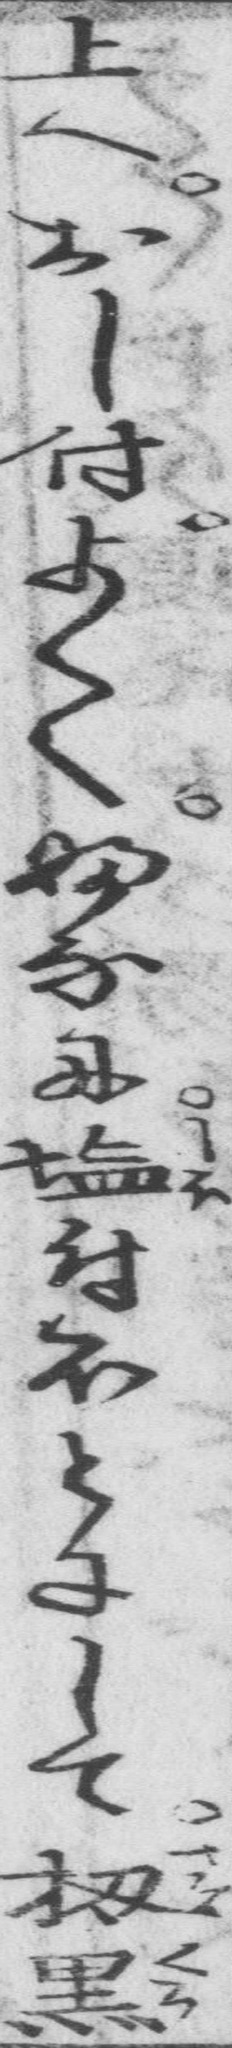上へ、おし付。よく〳〵。ふなに。塩つけほとにして。扨黒
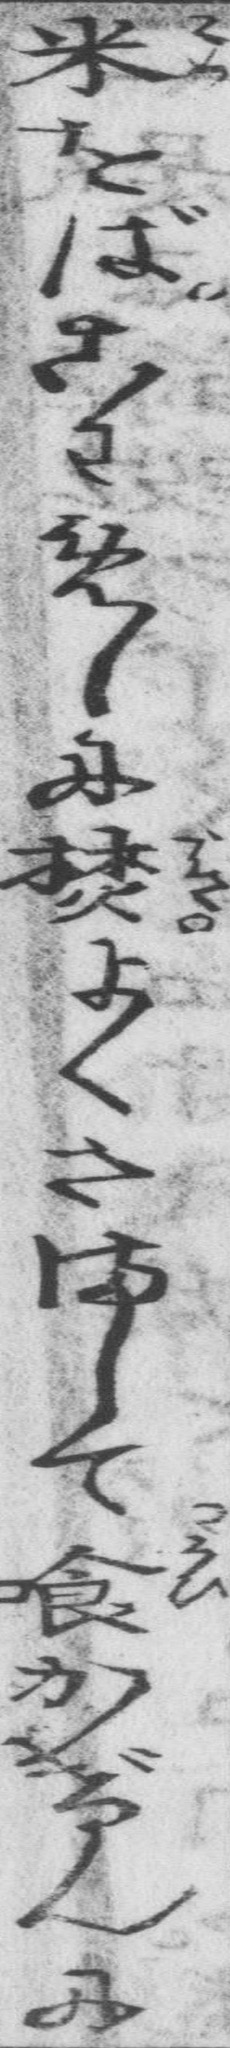米をば。こわめしに焚。よくさまして。喰かげんに
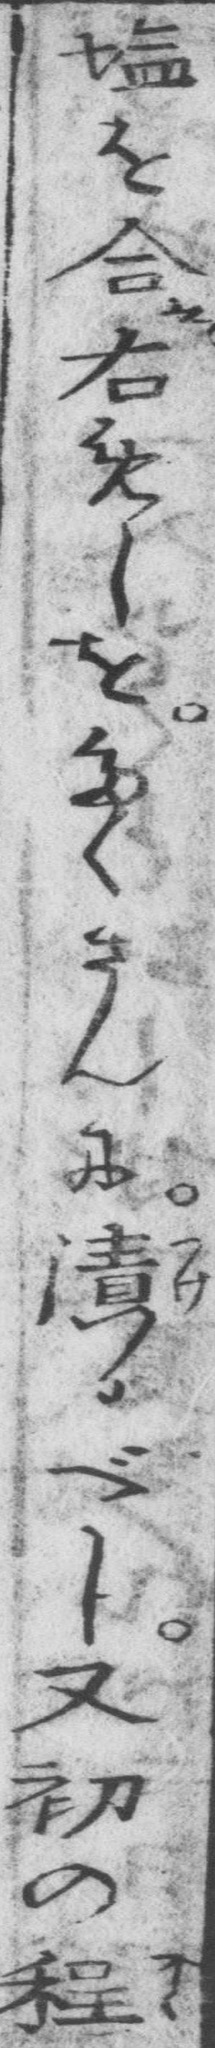塩を合せ。右めしを。たくさんに。漬るべし。又初の程
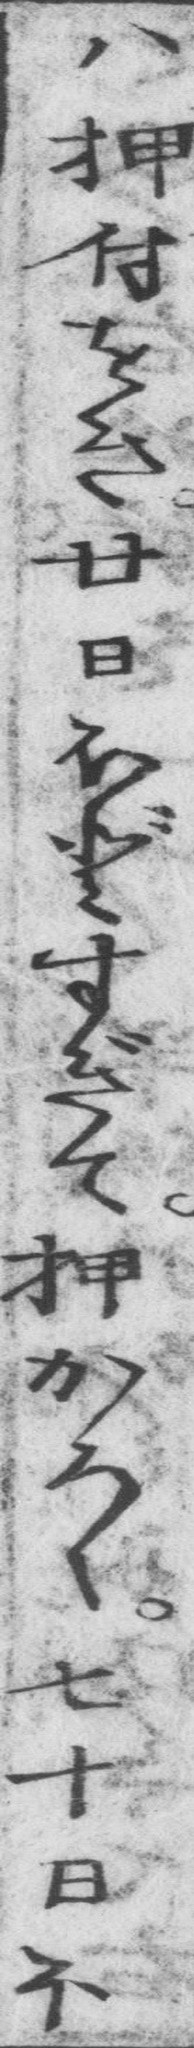は。押付をき。廿日ほどすぎて。押かろく。七十日ほ
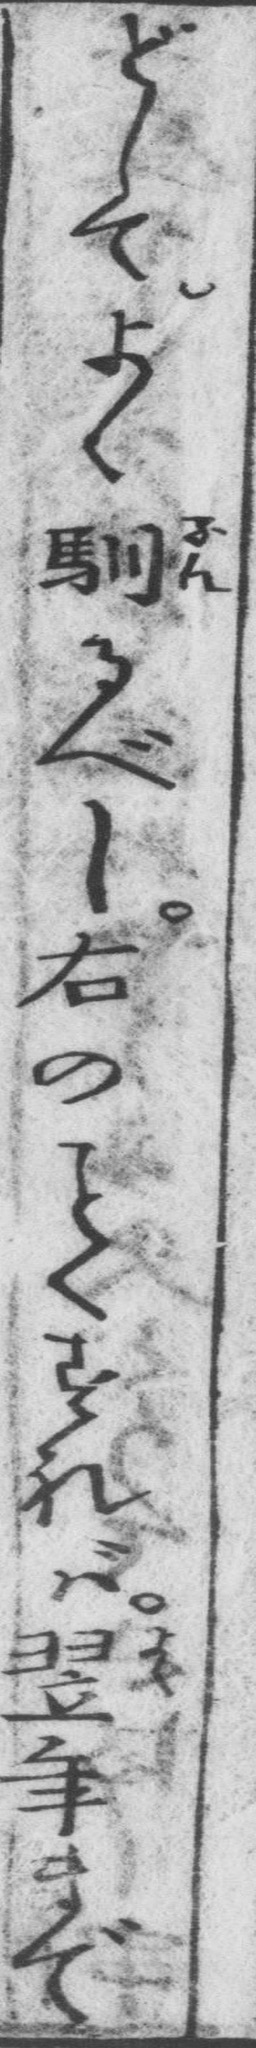どして。よく馴るべし。右のことくすれば。翌年まで
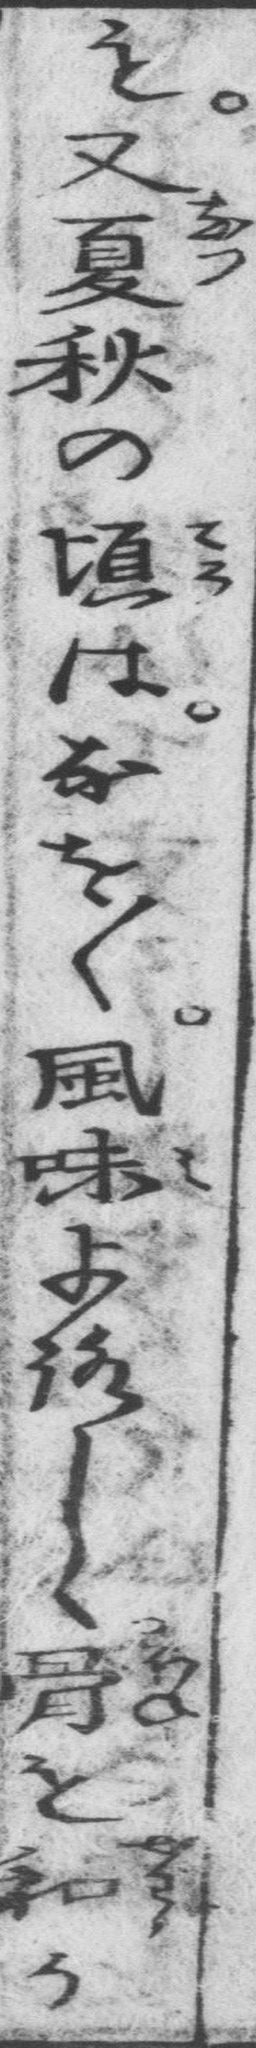も。又夏秋の頃は。なを〳〵。風味よろしく。骨も和か
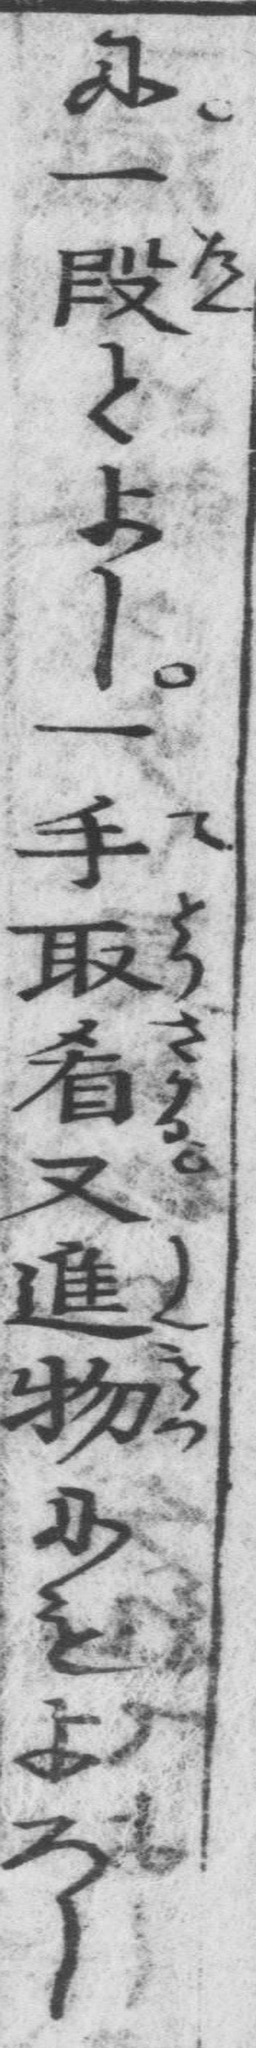に。一段とよし。一手取肴又進物にもよろし
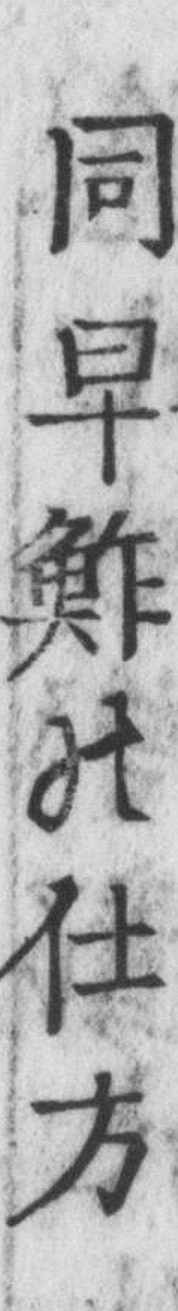同早鮓の仕方
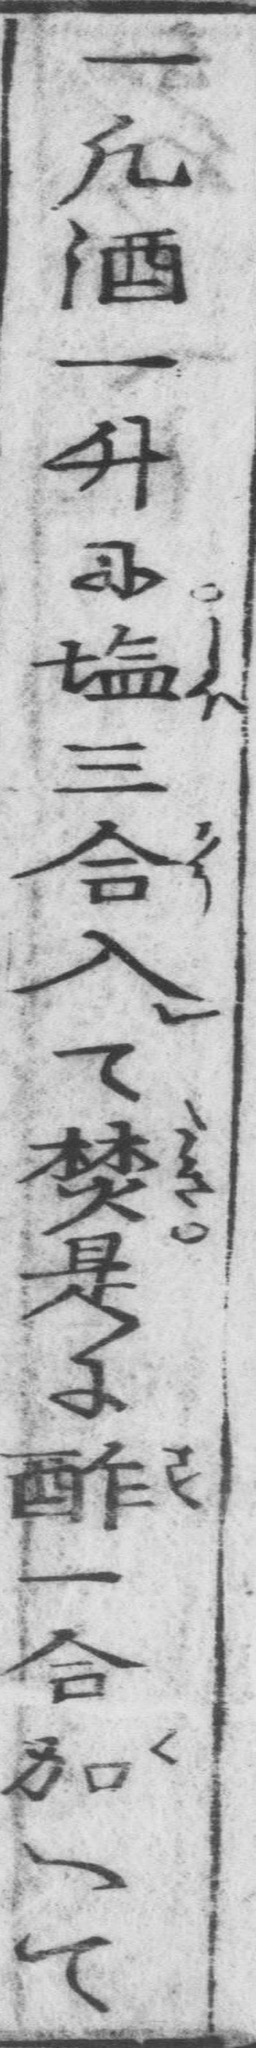一凡酒一升に。塩三合入れて焚。是に酢一合加へて
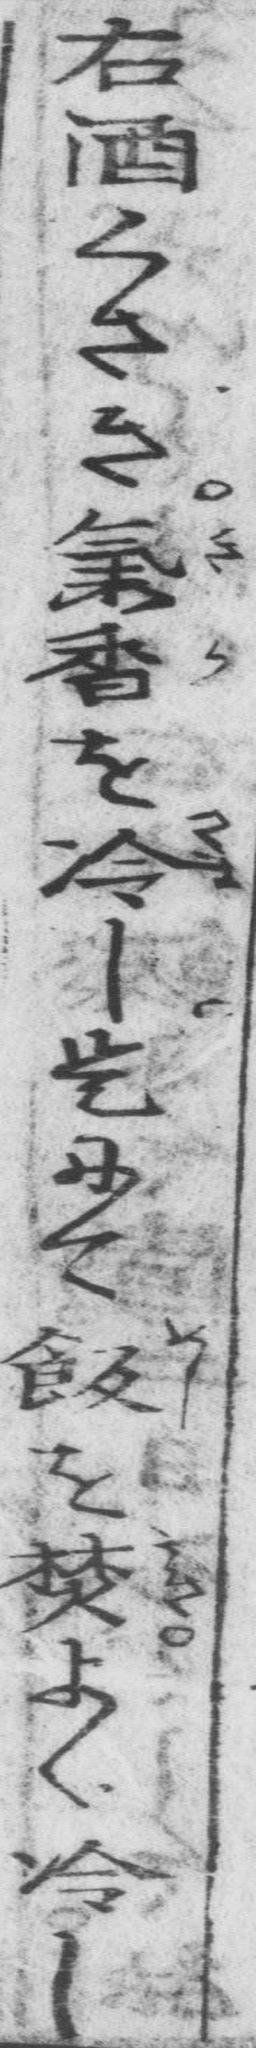右酒くさき。気香を冷し。是にて飯を焚。よく冷し
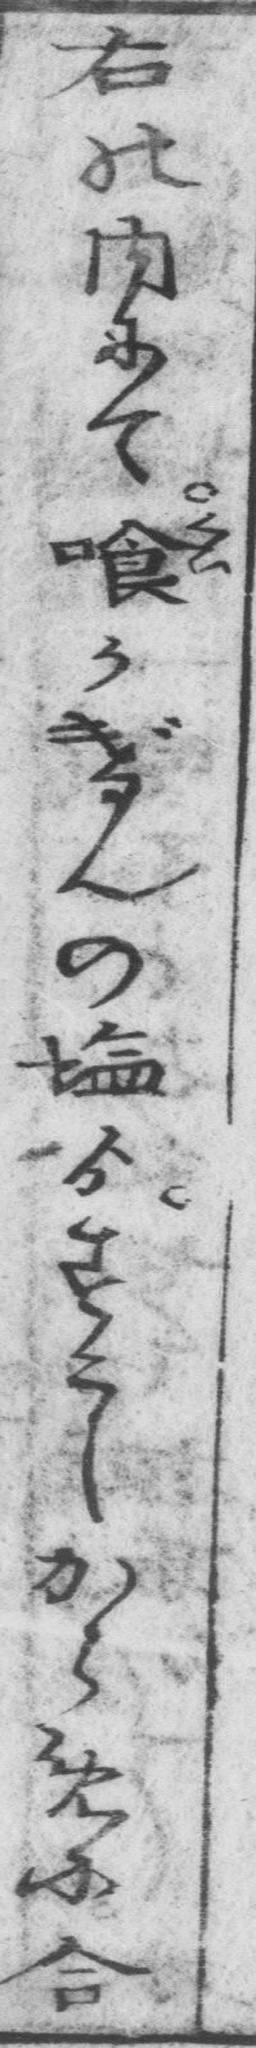右の内にて。喰かげんの塩ゟ。すこしからめに合

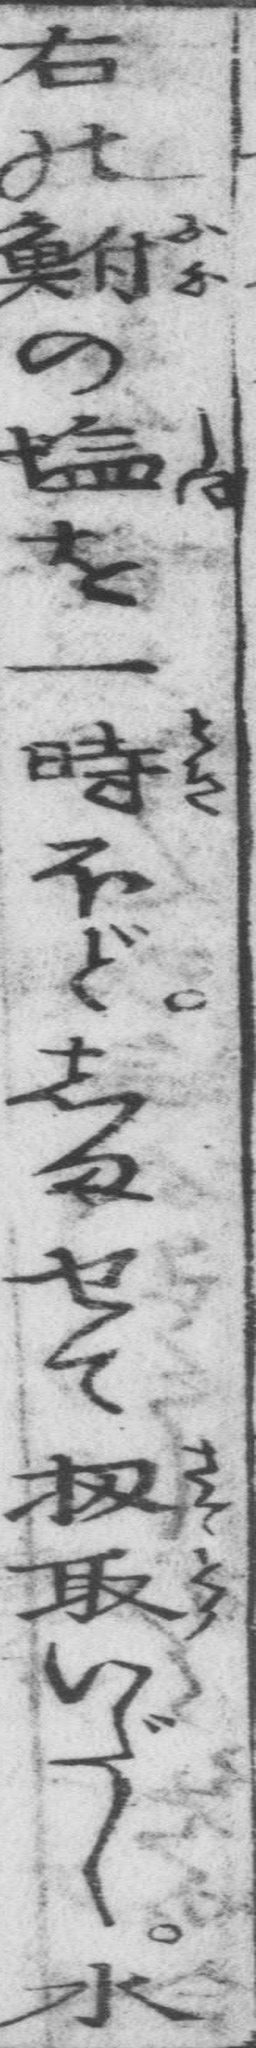右の鮒の塩を一時ほど。しませて扨取いだし。水
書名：萬寳料理秘密箱
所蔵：大阪府立大学学術情報センター 国文学研究資料館
